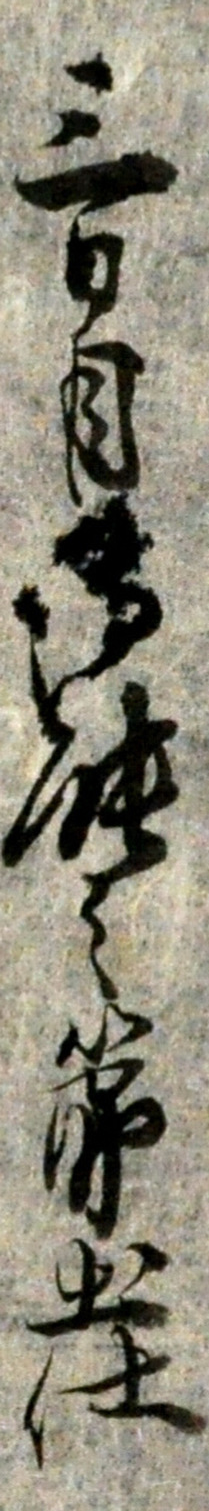三日目御能之節出仕
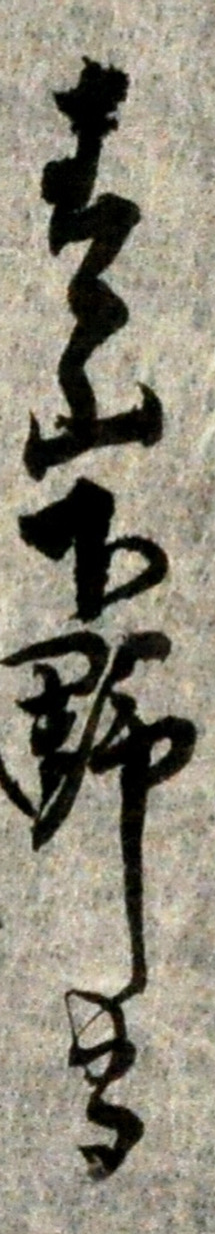青山下野守
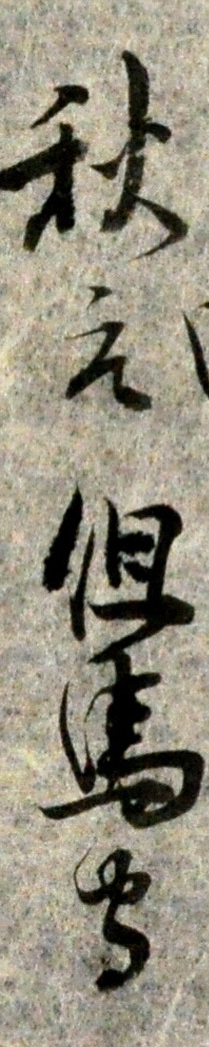秋元但馬守
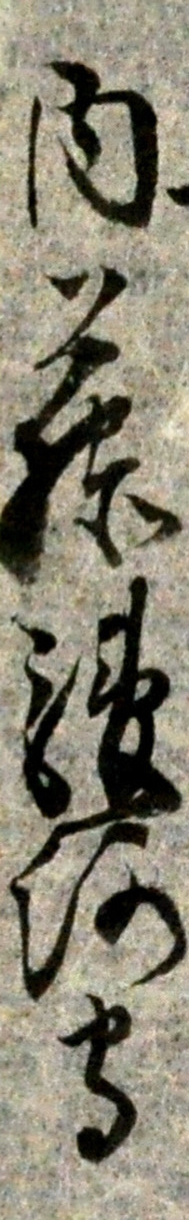内藤駿河守
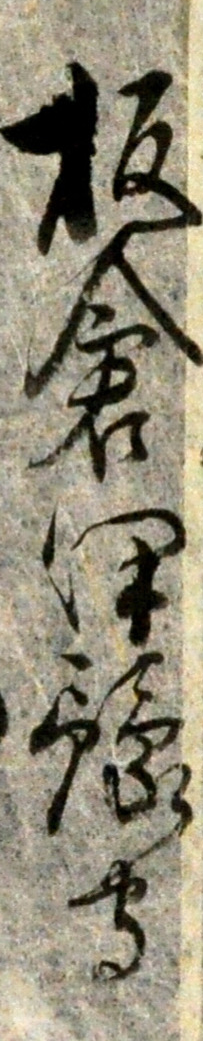板倉伊予守
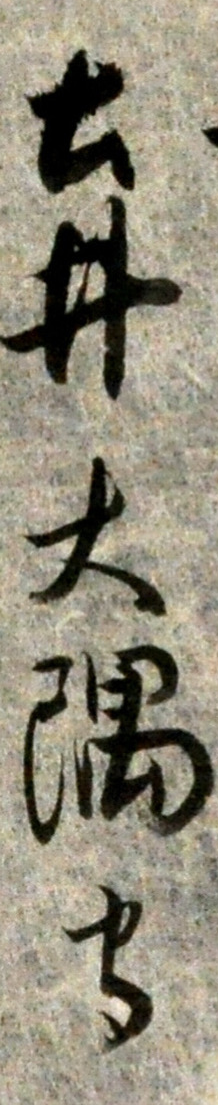土井大隅守
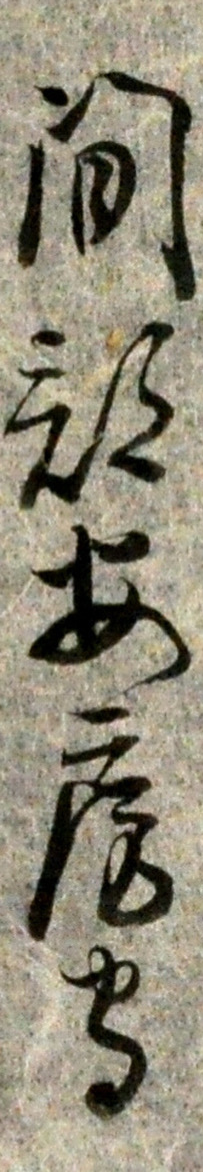間部安房守
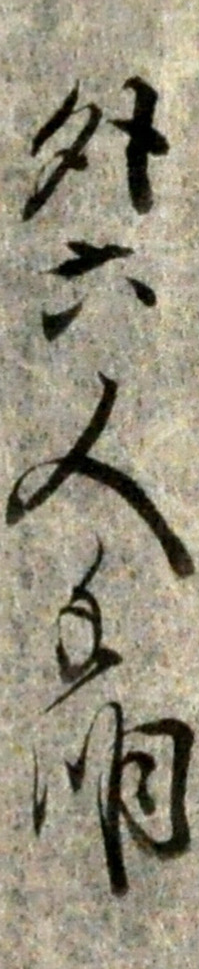外六人手明
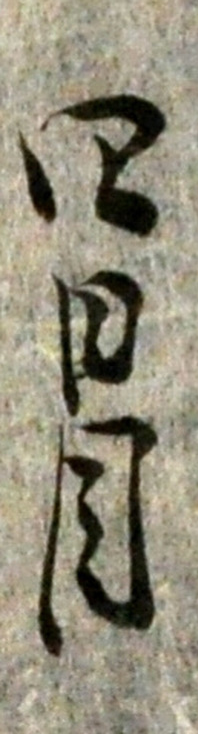四日目
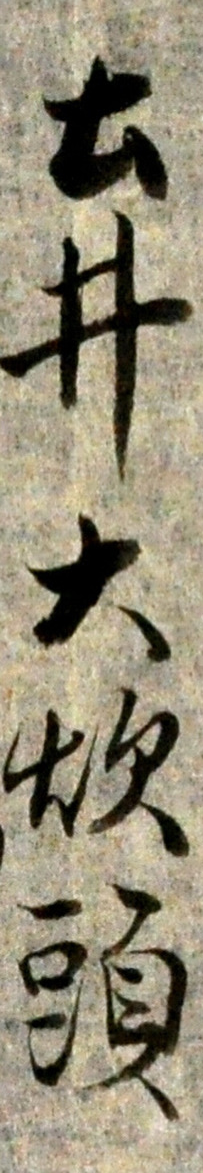土井大炊頭
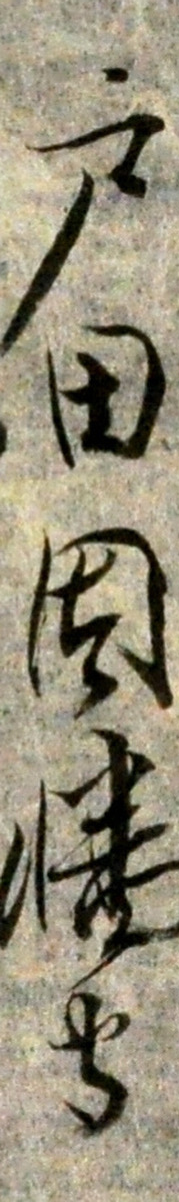戸田因幡守
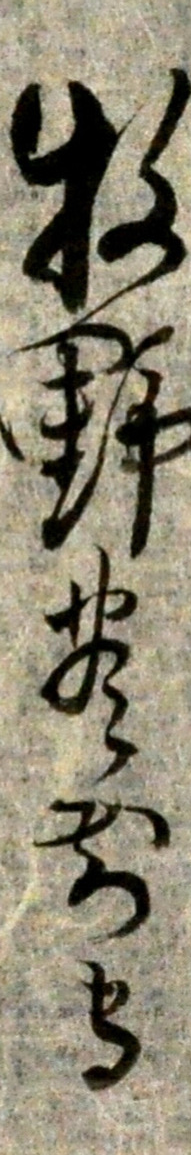牧野豊前守
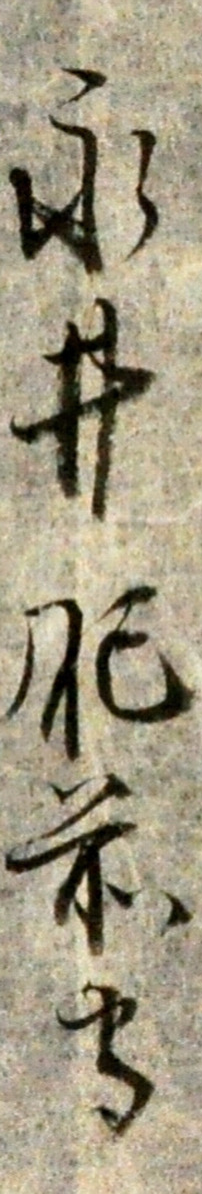永井肥前守
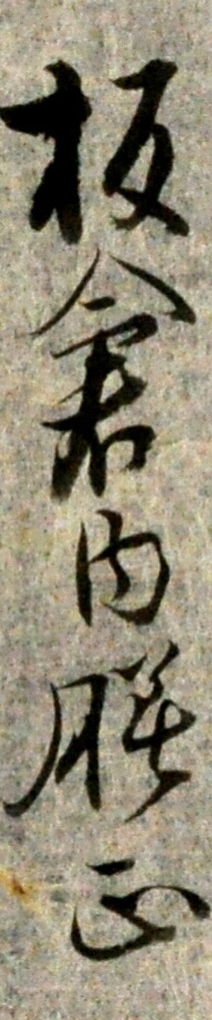板倉内膳正
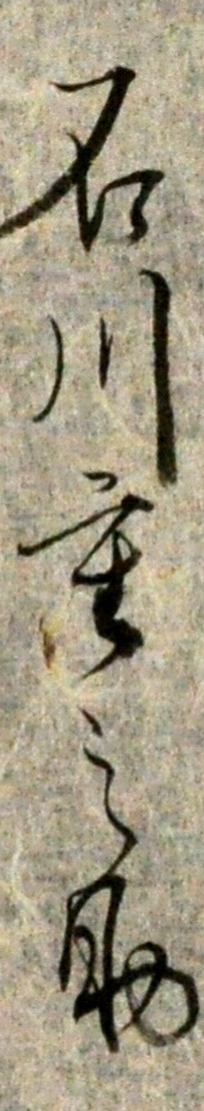石川重之助
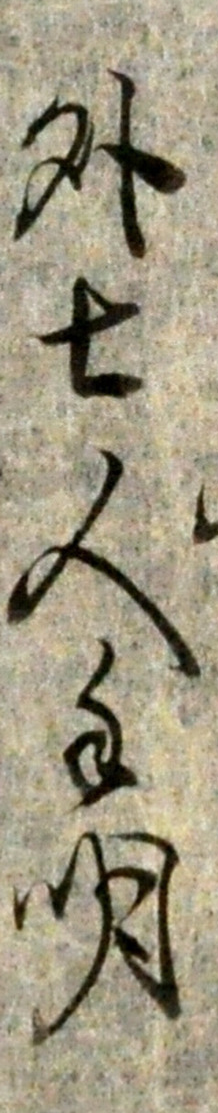外七人手明
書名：御馳走御能ノ節ノ留外
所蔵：伊那市立高遠町図書館・合同会社AMANE
